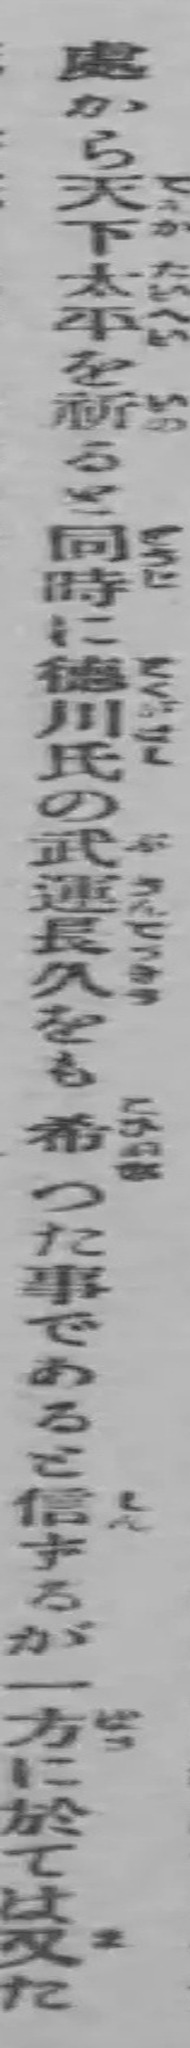処から天下太平を祈ると同時に徳川氏の武運長久をも希つた事であると信ずるが一方に於ては又た
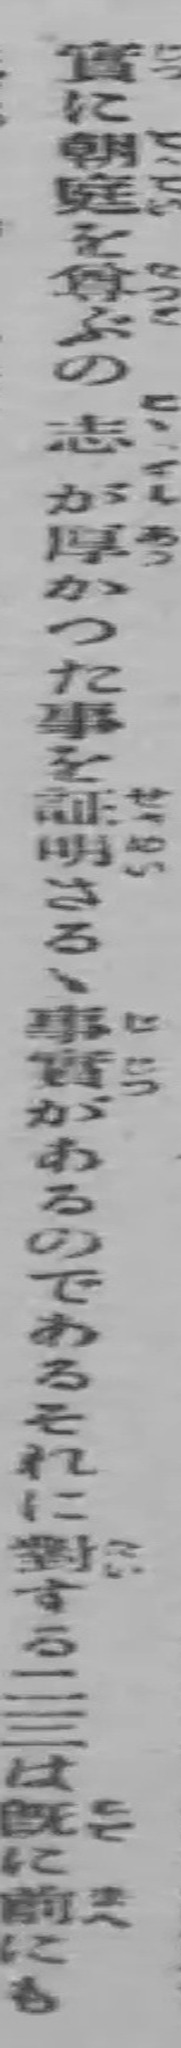実に朝庭を尊ぶの志が厚かつた事を証明さるゝ事実があるのであるそれに対する二三は既に前にも
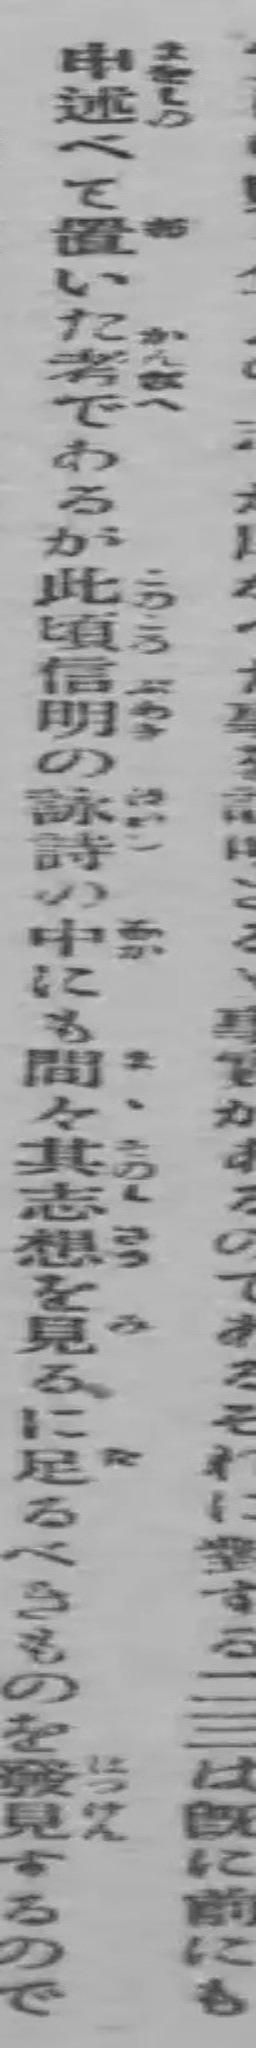申述べて置いた考であるが此頃信明の詠詩の中にも間々其志想を見るに足るべきものを発見するので
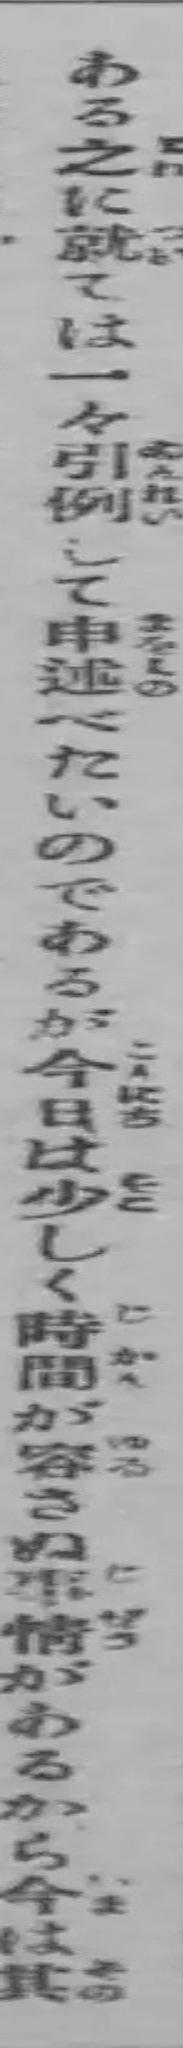ある之に就ては一々引例して申述べたいのであるが今日は少しく時間が容さぬ事情があるから今は其
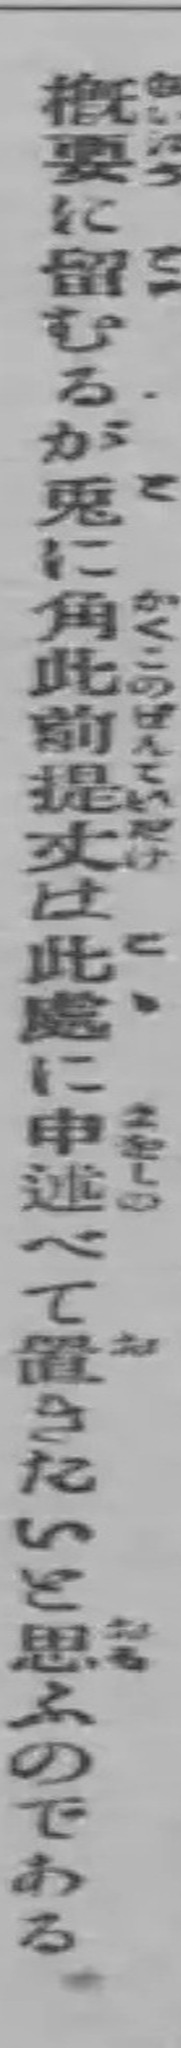概要に留むるが兎に角此前提丈は此処に申述べて置きたいと思ふのである
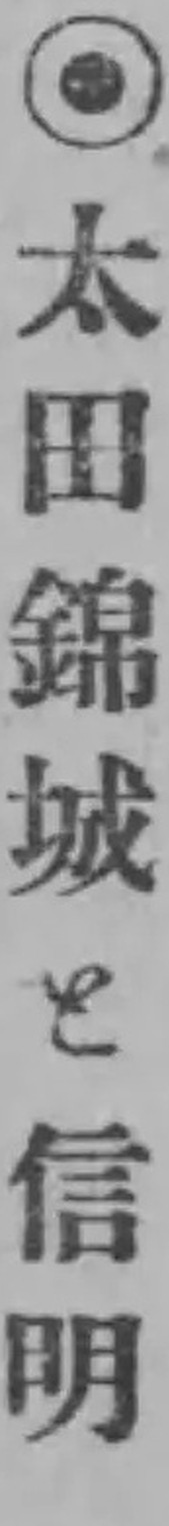⦿太田錦城と信明
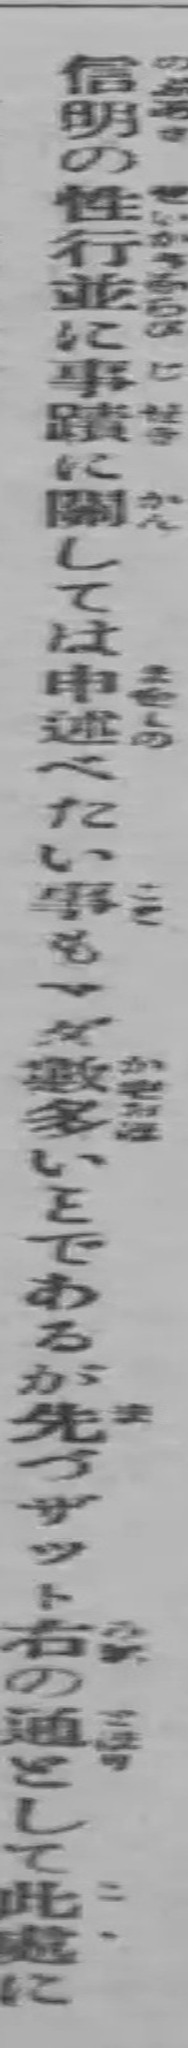信明の性行並に事蹟に関しては申述べたい事もマダ数多いことであるが先づザツト右の通として此処に
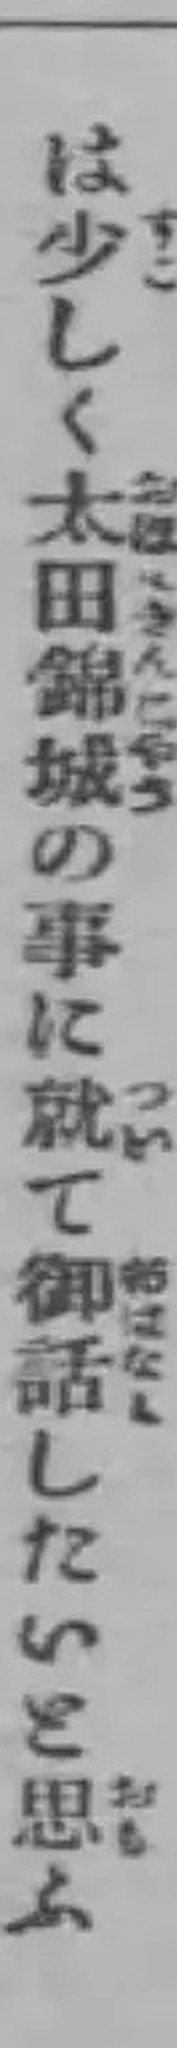は少しく太田錦城の事に就て御話したいと思ふ
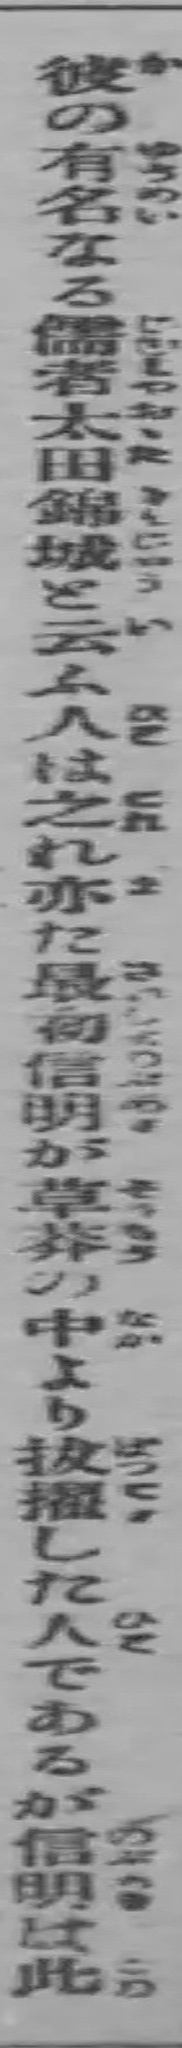彼の有名なる儒者太田錦城と云ふ人は之亦た最初信明が草莽の中より抜擢した人であるが信明は此
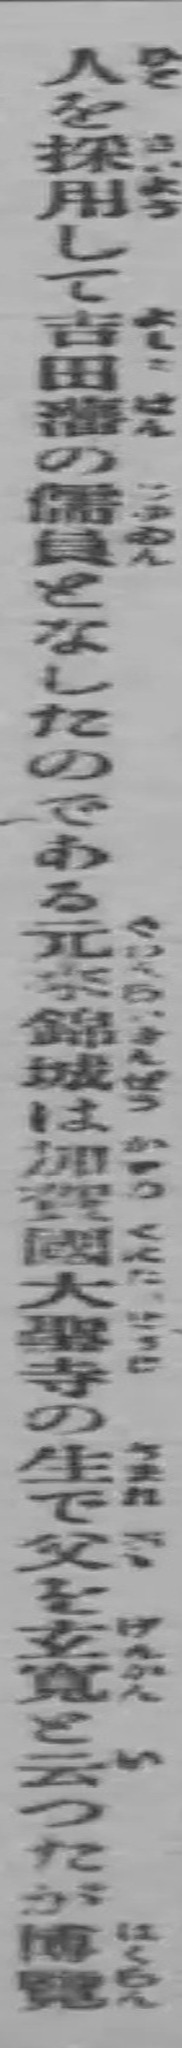太田錦城人を採用して吉田藩の儒員となしたのである元来錦城は加賀国大聖寺の生で父を玄寛と云つたが博覧
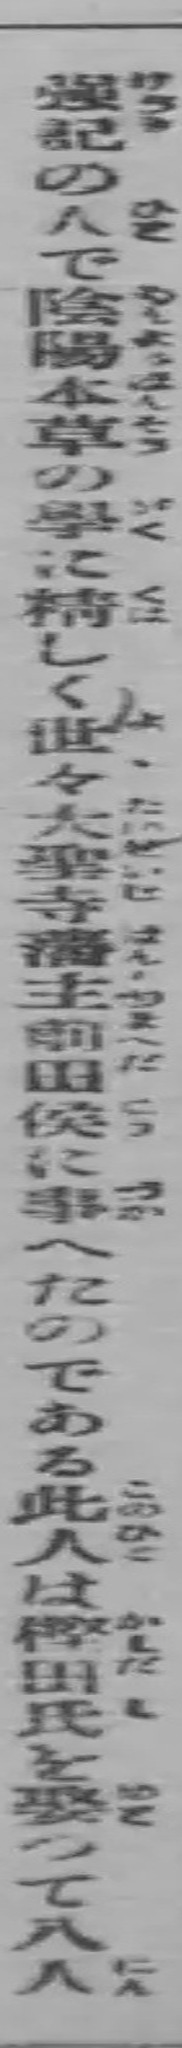強気の人で陰陽本草の学に精しく世々大聖寺藩主前田侯に事へたのである此人は樫田氏を娶つて八人
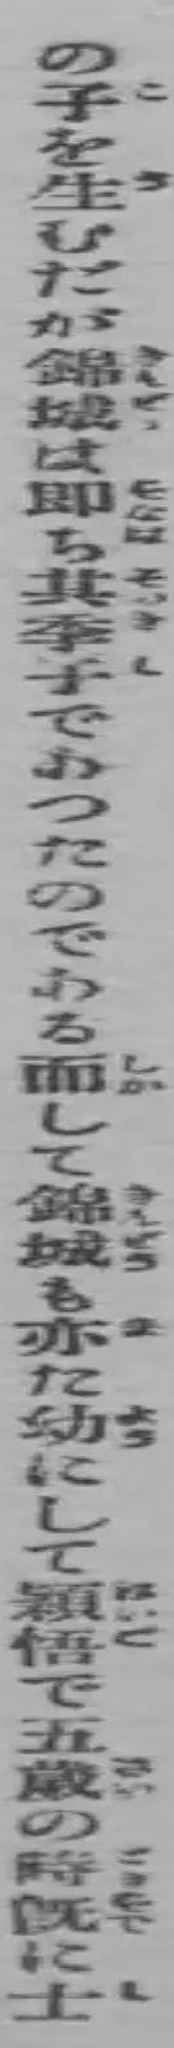の子を生むだが錦城は即ち其季子であつたのである而して錦城も亦た幼にして頴悟で五歳の時既に士
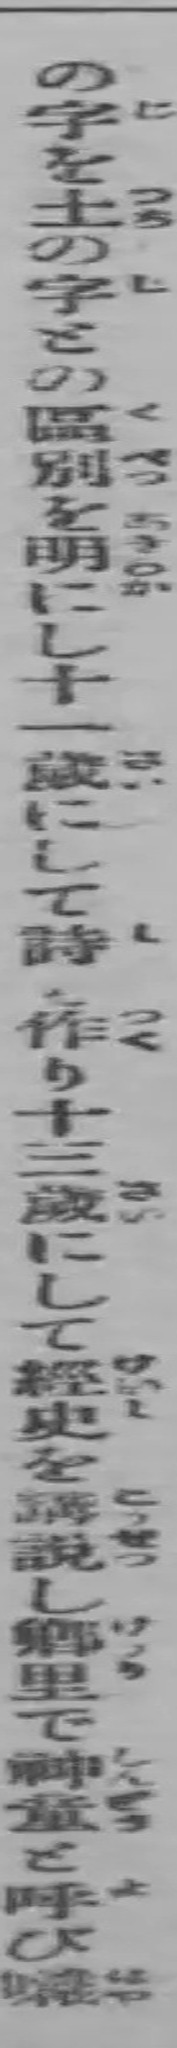の字を土の字との区別を明にし十一歳にして詩を作り十三歳にして経史を講説し郷里で神童と呼び囃
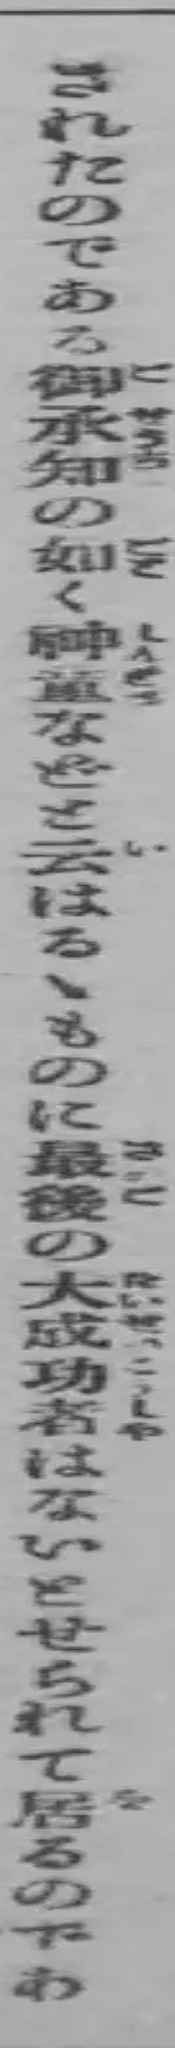されたのである御承知の如く神童などと云はるゝものに最後の大成功者はないとせられて居るのであ
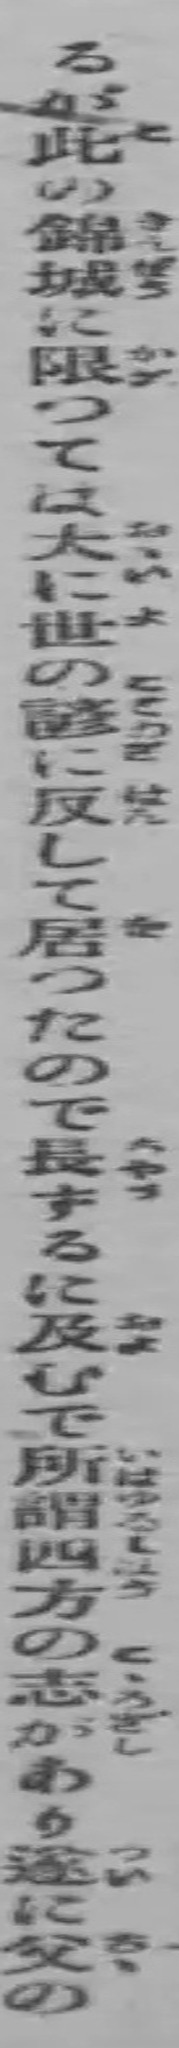るが此の錦城に限つては大に世の諺に反して居つたので長ずるに及むで所謂四方の志があり遂に父の
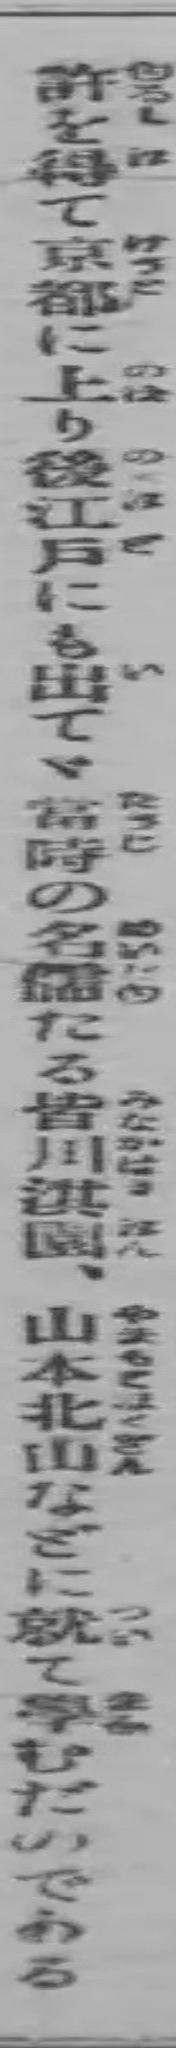許を得て京都に上り後江戸にも出てゞ当時の名儒たる皆川淇園、山本北山などに就て学むだのである
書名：豊橋市史談
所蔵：国立国会図書館 National Diet Library, JAPAN
